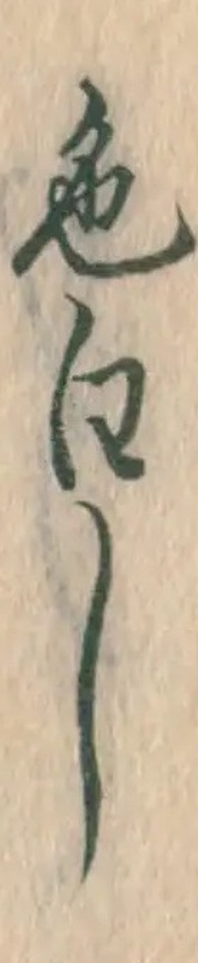色白し
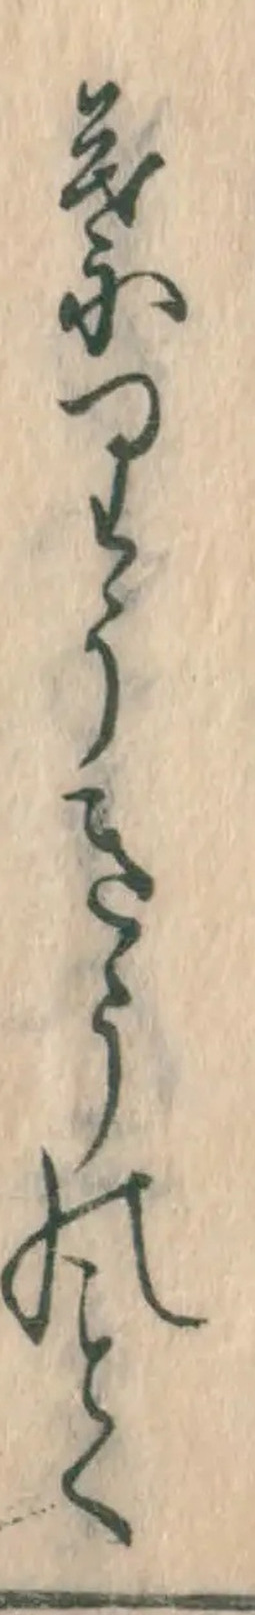葉りうきうのことく

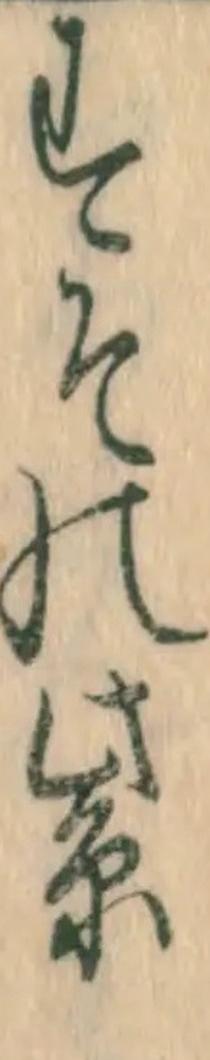すその紫
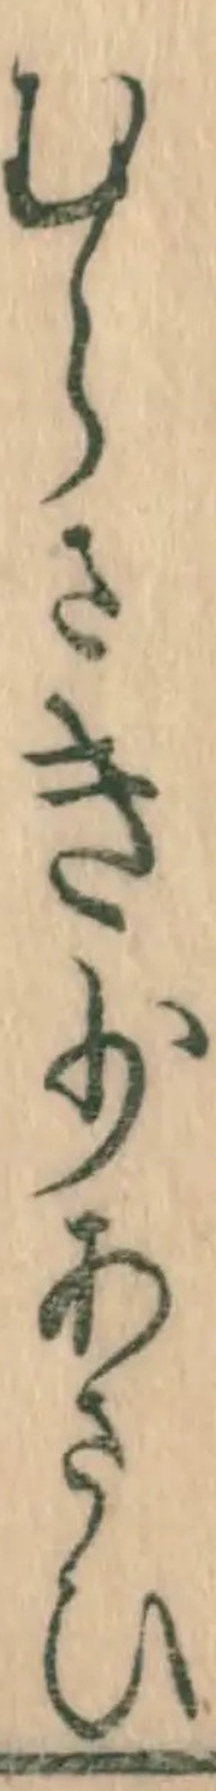むらさき少あさひ
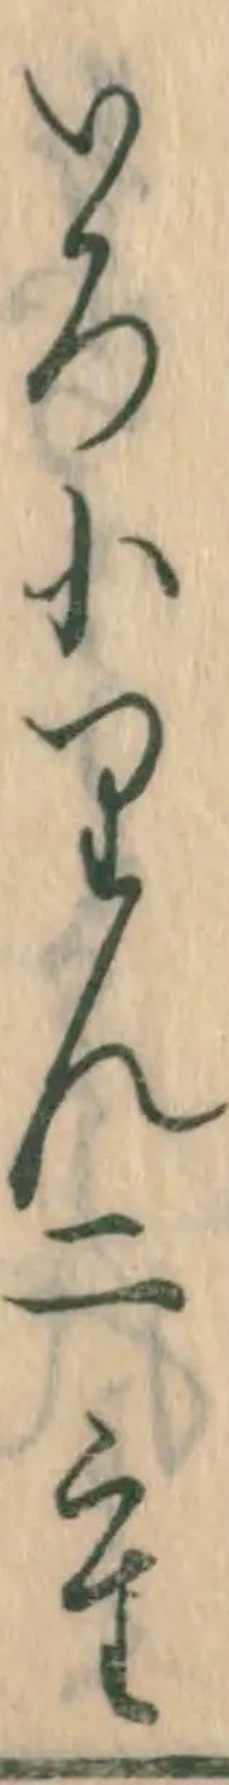いろ小りん二重
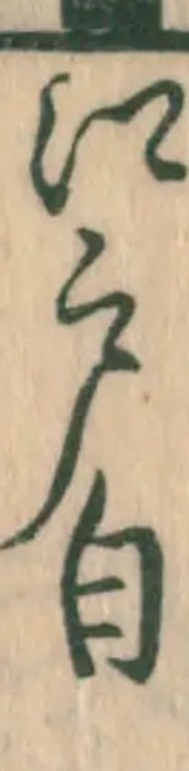江戸白
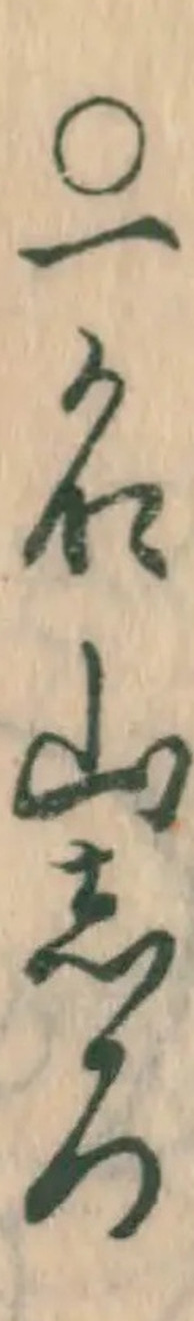○一名山しろ
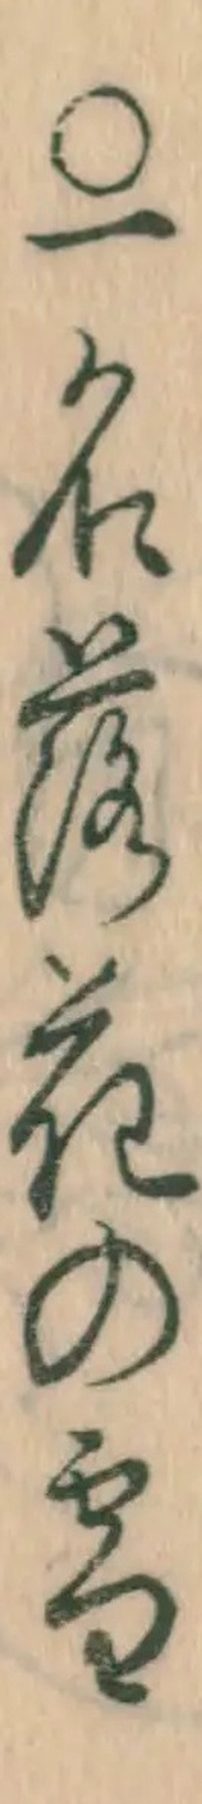○一名落花の雪
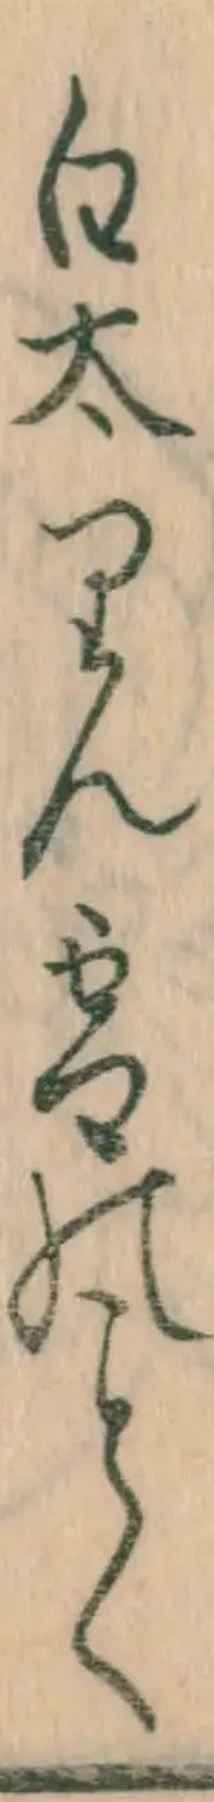白太りん雪のことく
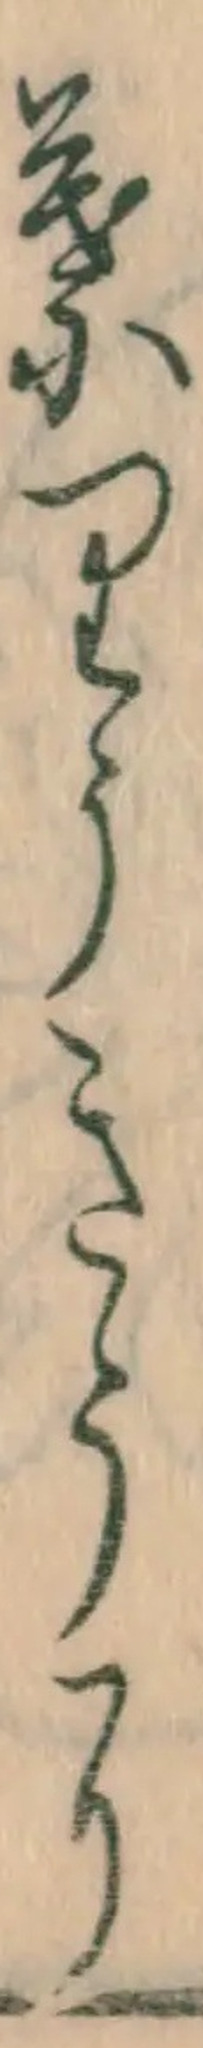葉りうきうに
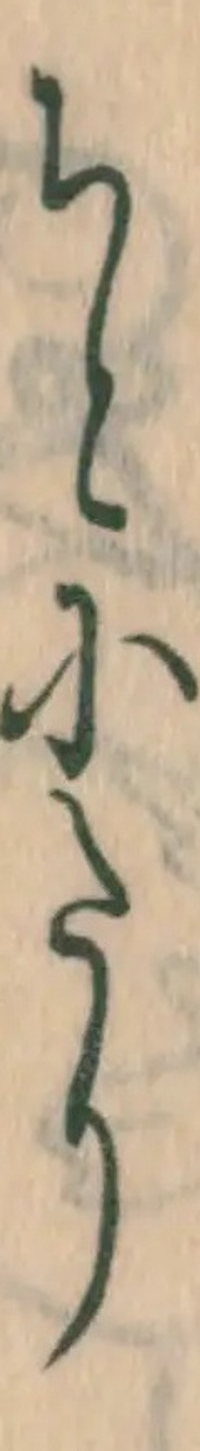ちとにたり
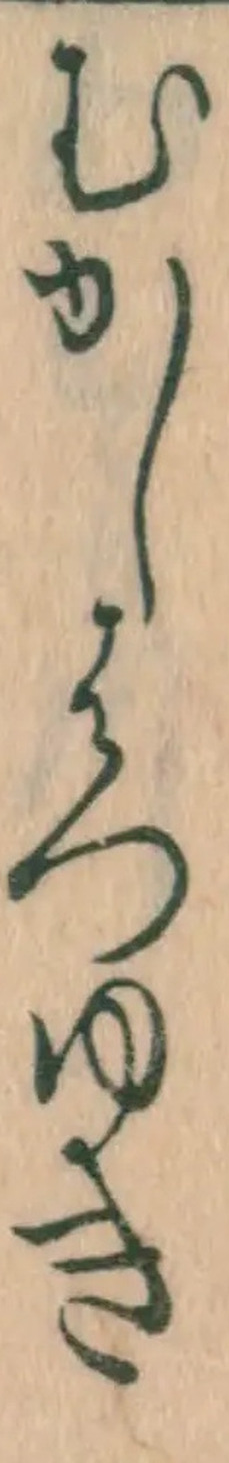むかしはつゆき
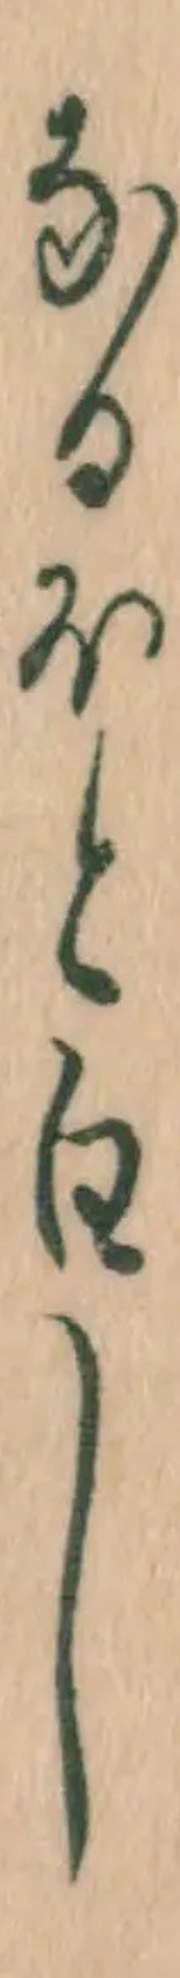なるほと白し
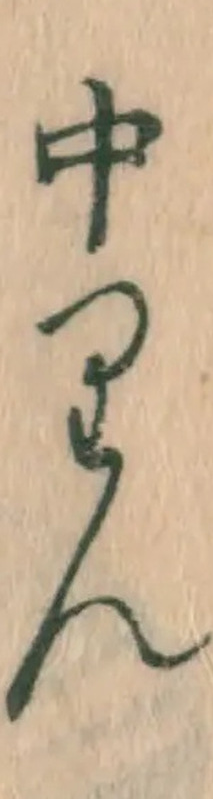中りん
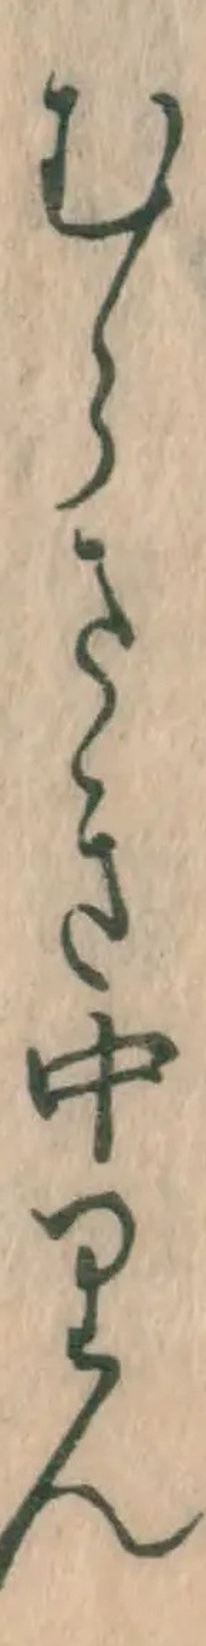むらさき中りん
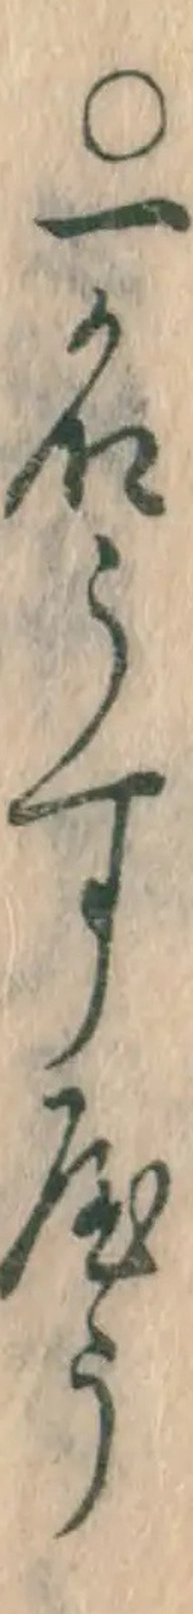○一名うすやう
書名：錦繍枕 5巻. [3]
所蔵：国立国会図書館 National Diet Library, JAPAN
